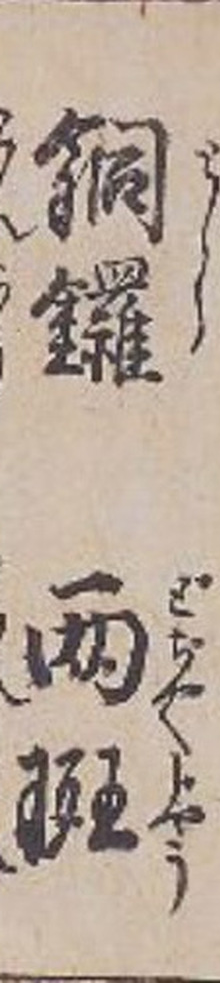銅鑼両班
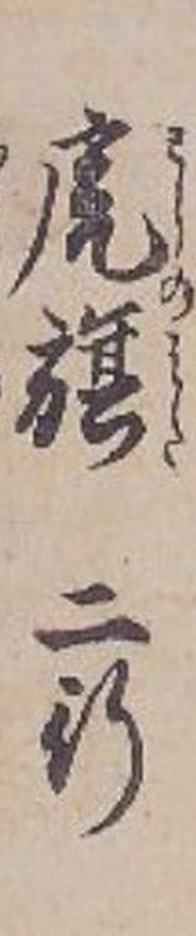虎旗二行

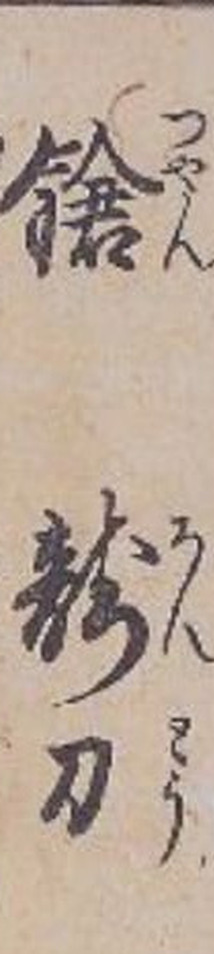鎗龍刀
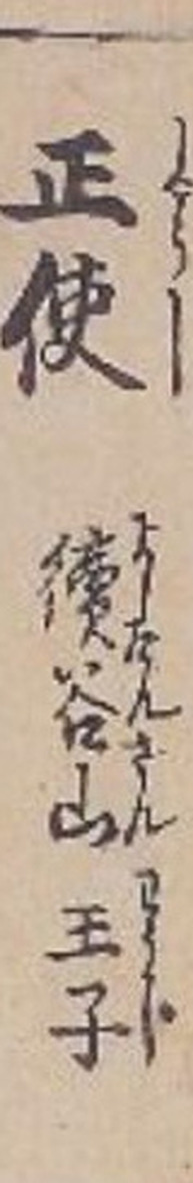正使読谷山王子
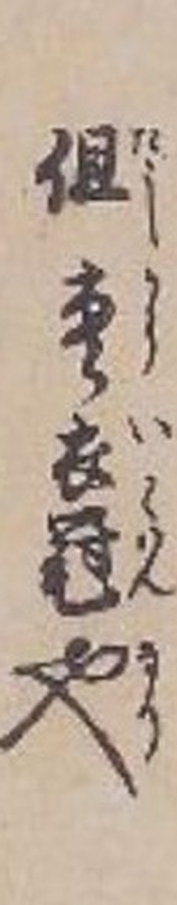但唐衣冠也
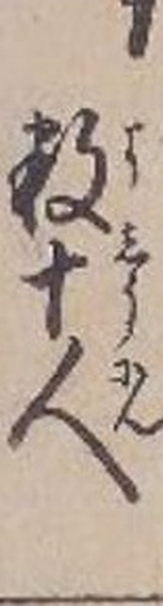数十人

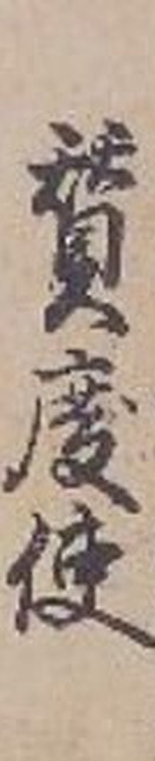賛度使
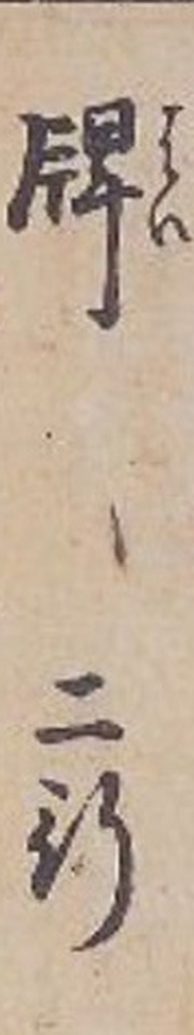牌二行
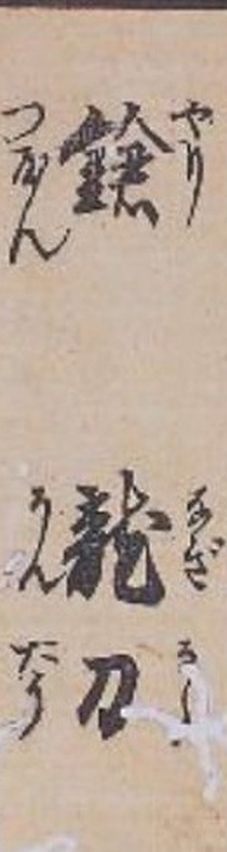鎗龍刀
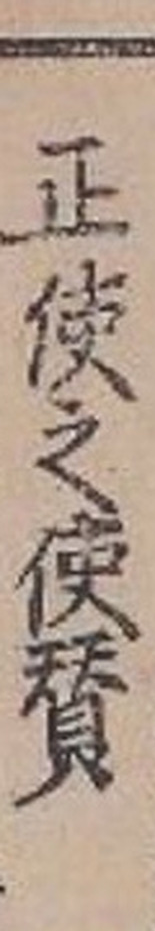正使の使賛
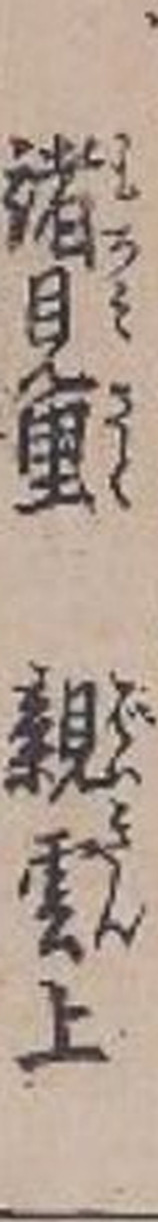諸見里親雲上
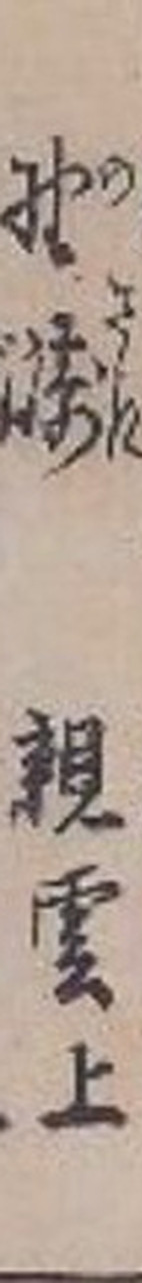野崎親雲上
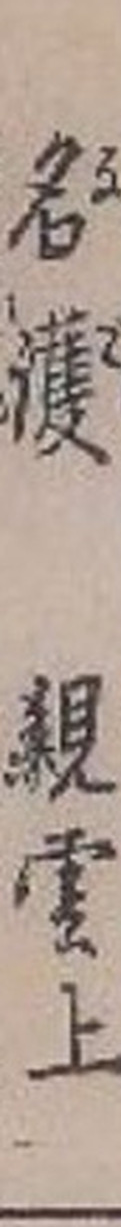名護親雲上

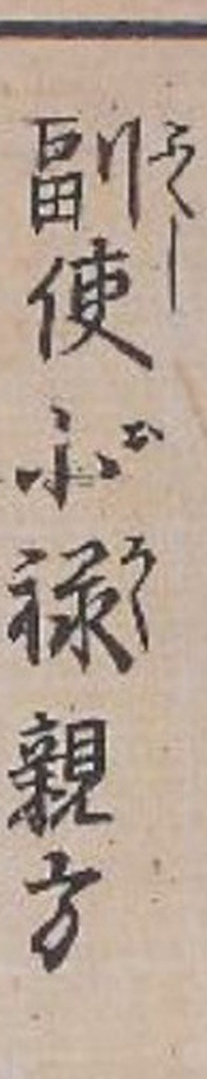副使小禄親方
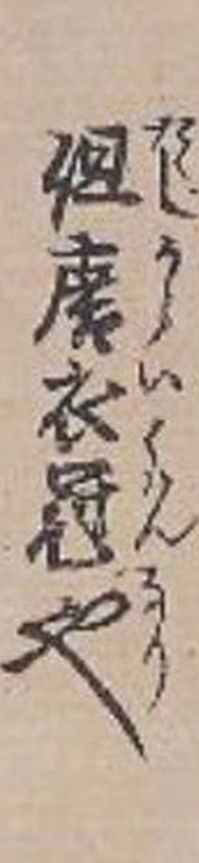但唐衣冠也
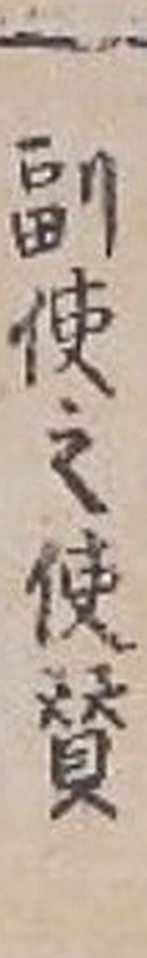副使の使賛
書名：琉球人大行列記 来朝新板絵入
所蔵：University of the Ryukyus Library
